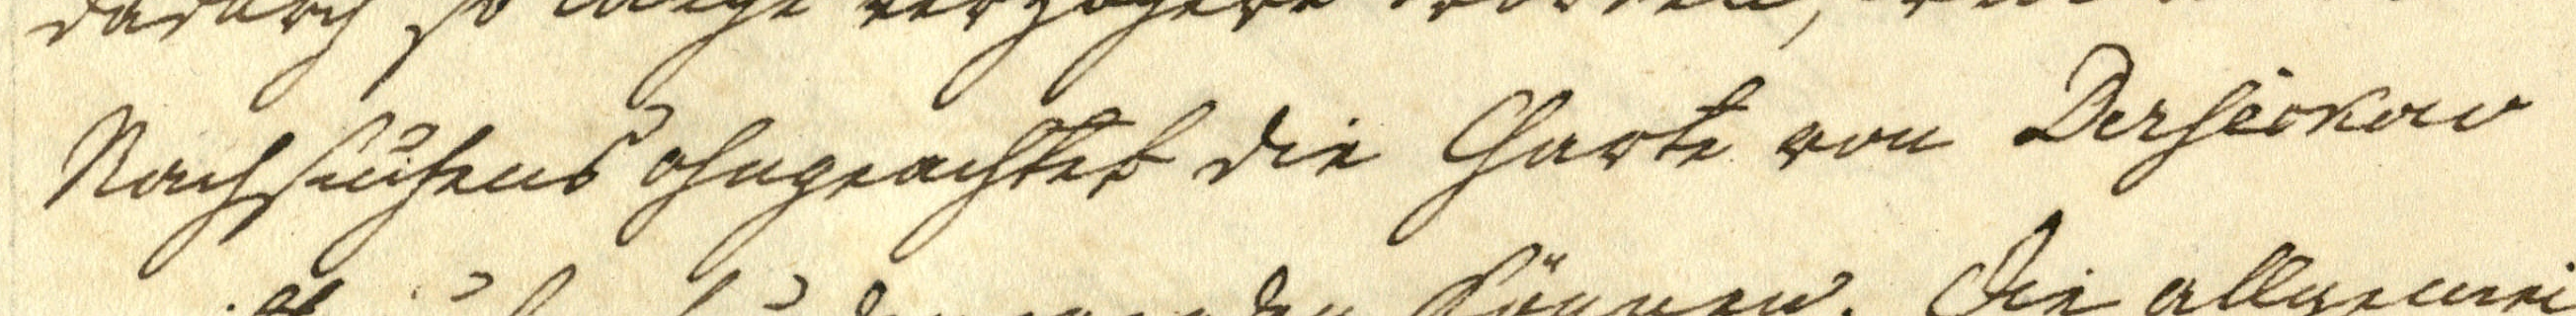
Nachsuchens ohngeachtet die Charte von Derseckow
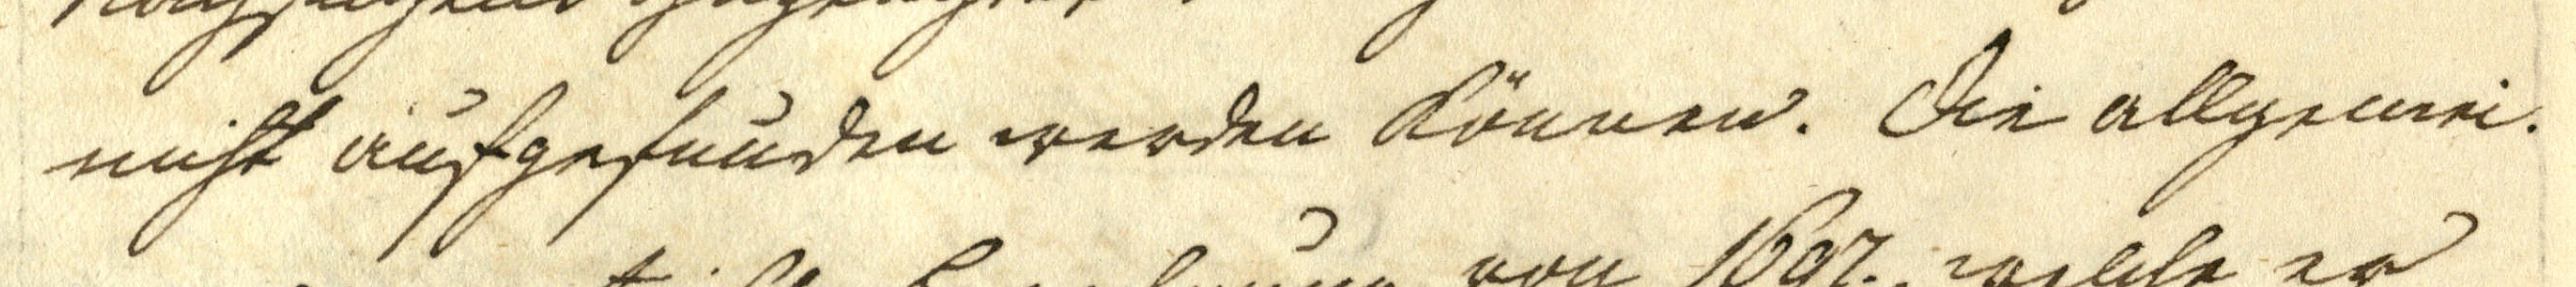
nicht aufgefunden werden können. Die allgemei¬
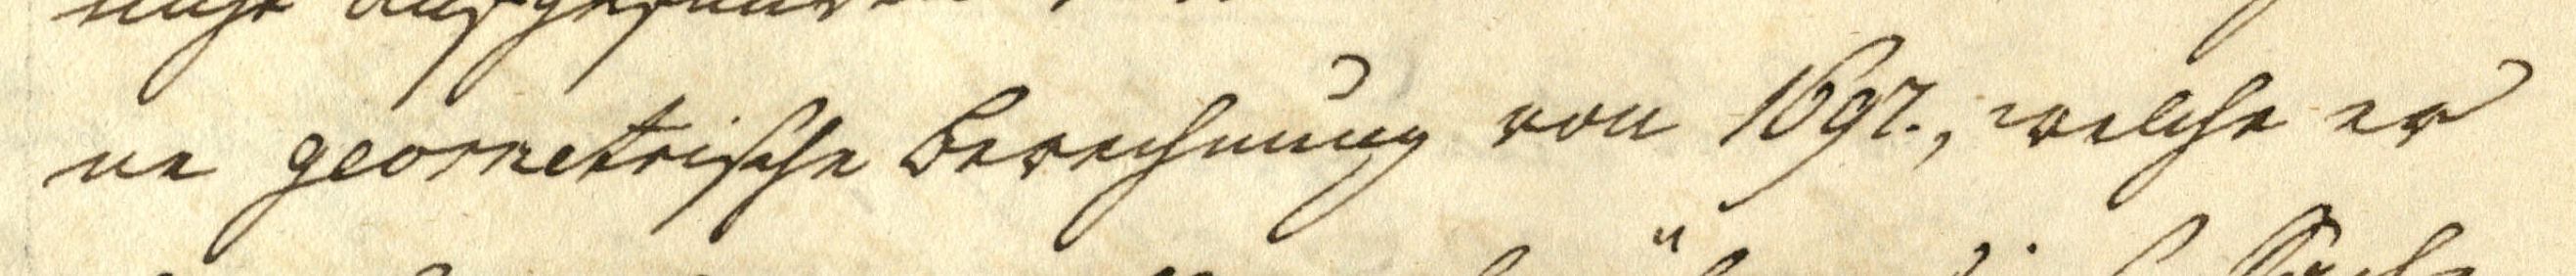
ne geometrische Berechnung von 1697., welche er
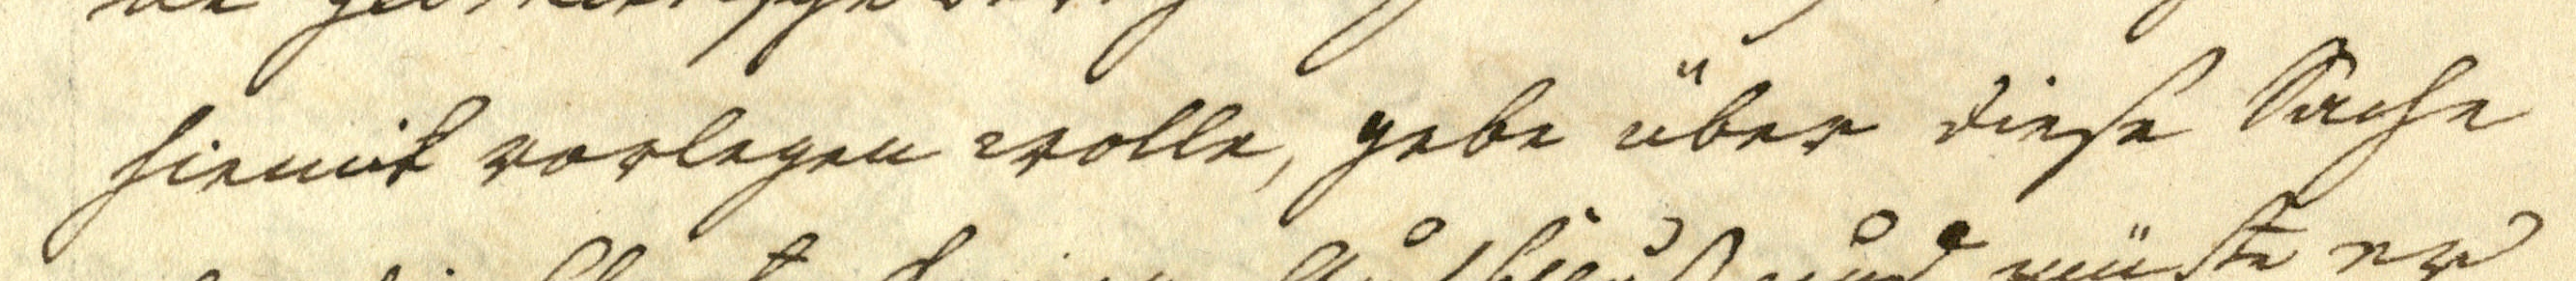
hiemit vorlegen wolle, gebe über diese Sache
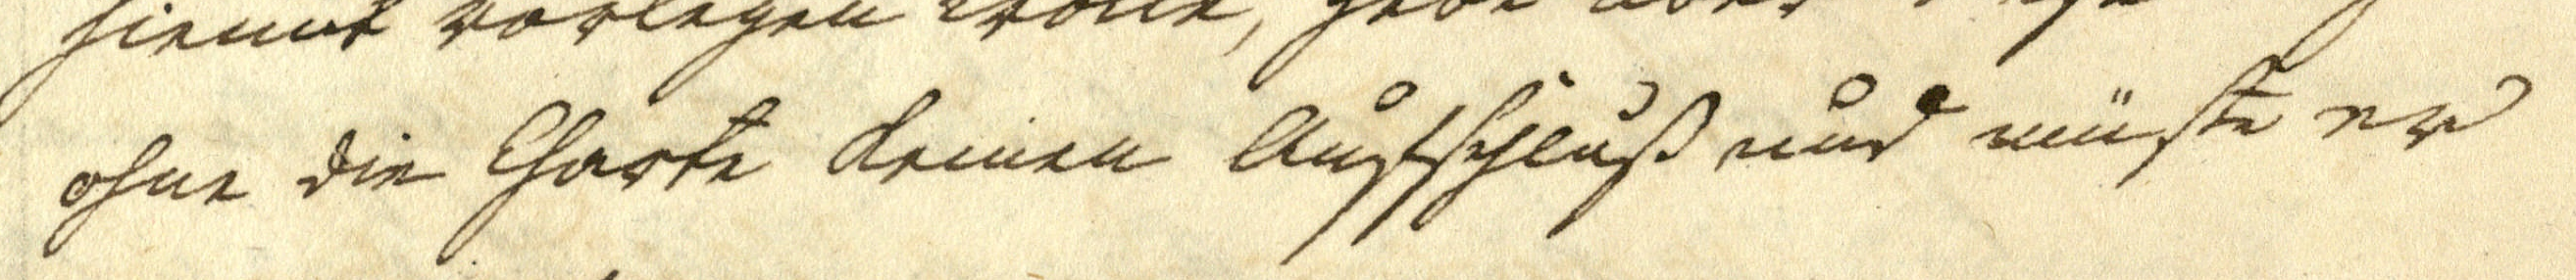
ohne die Charte keinen Aufschluß und müßte er
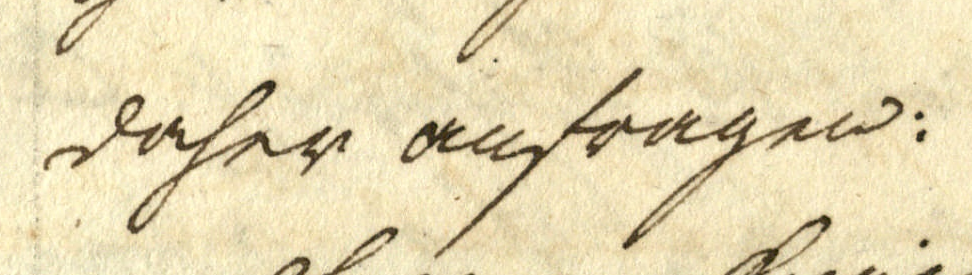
daher anfragen:
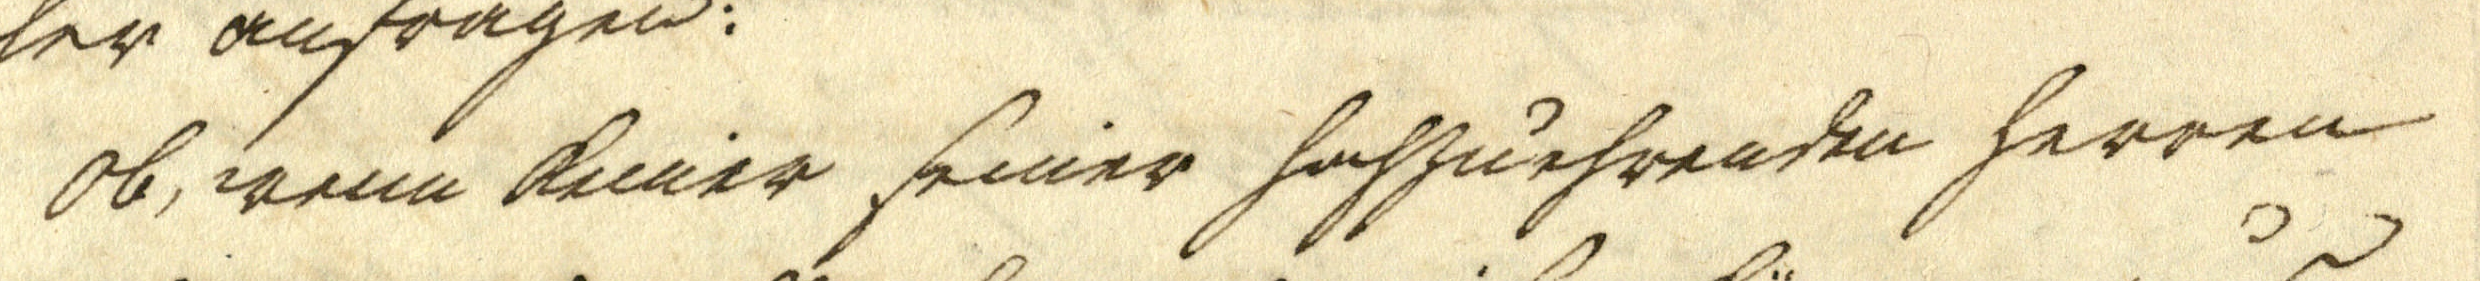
ob, wenn keiner seiner Hochzuehrenden Herren
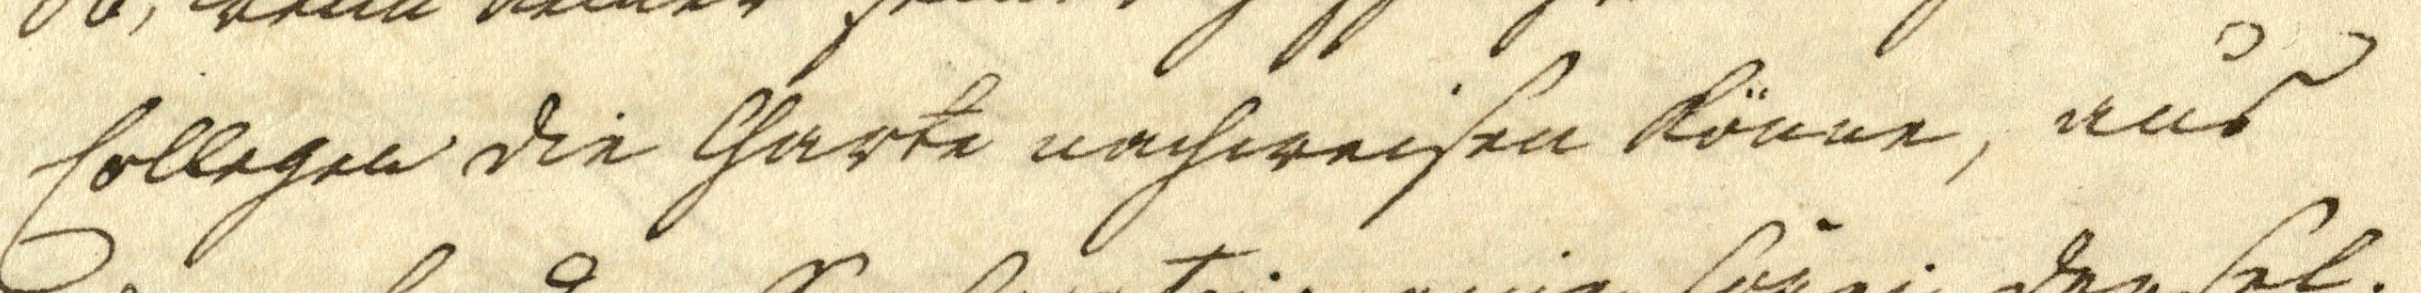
Collegen die Charte nachweisen könne, aus
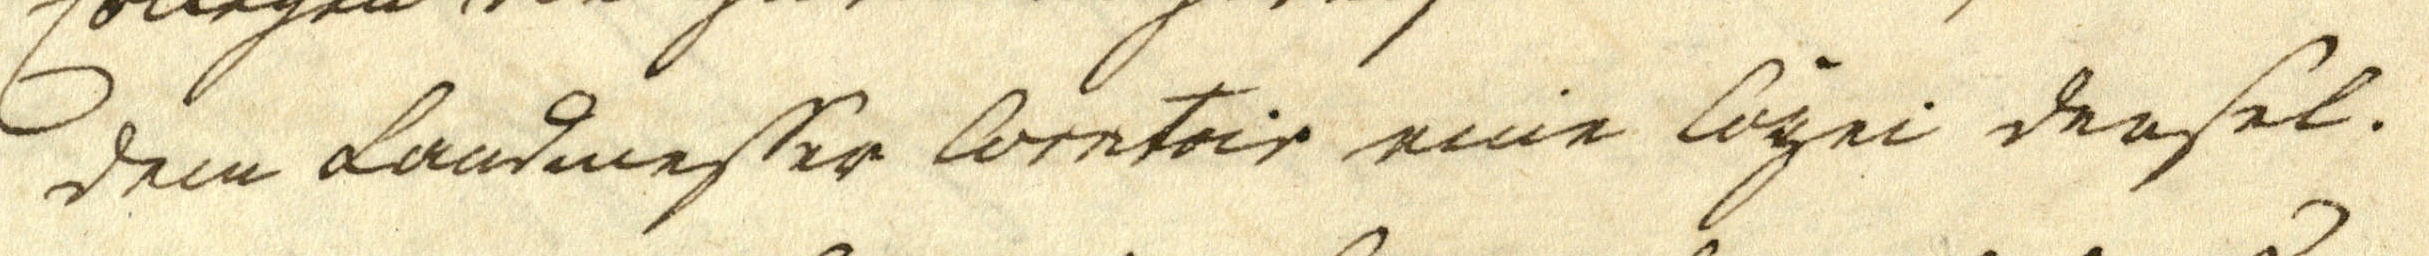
dem Landmesser Contoir eine Copei dersel¬
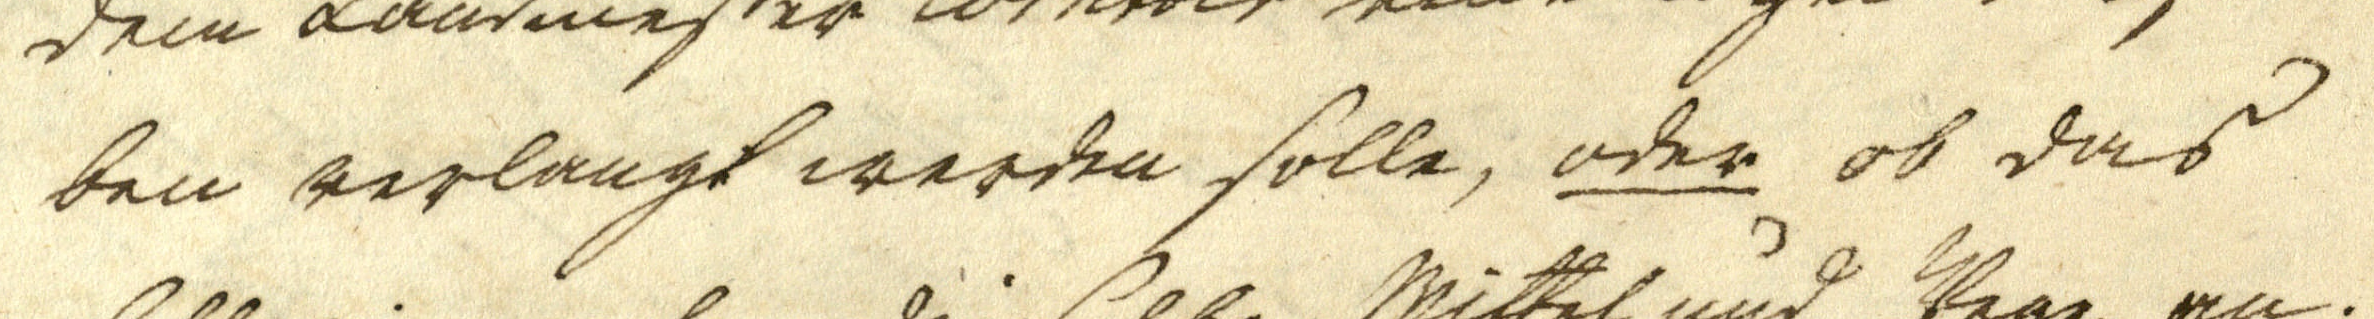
ben verlangt werden solle, oder ob das
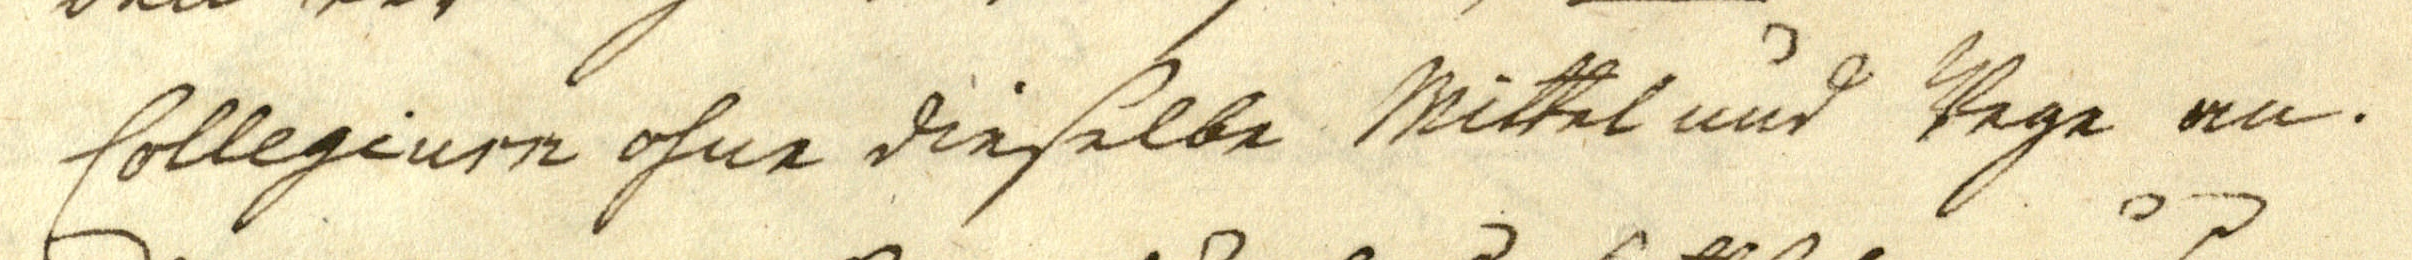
Collegium ohne dieselbe Mittel und Wege an¬
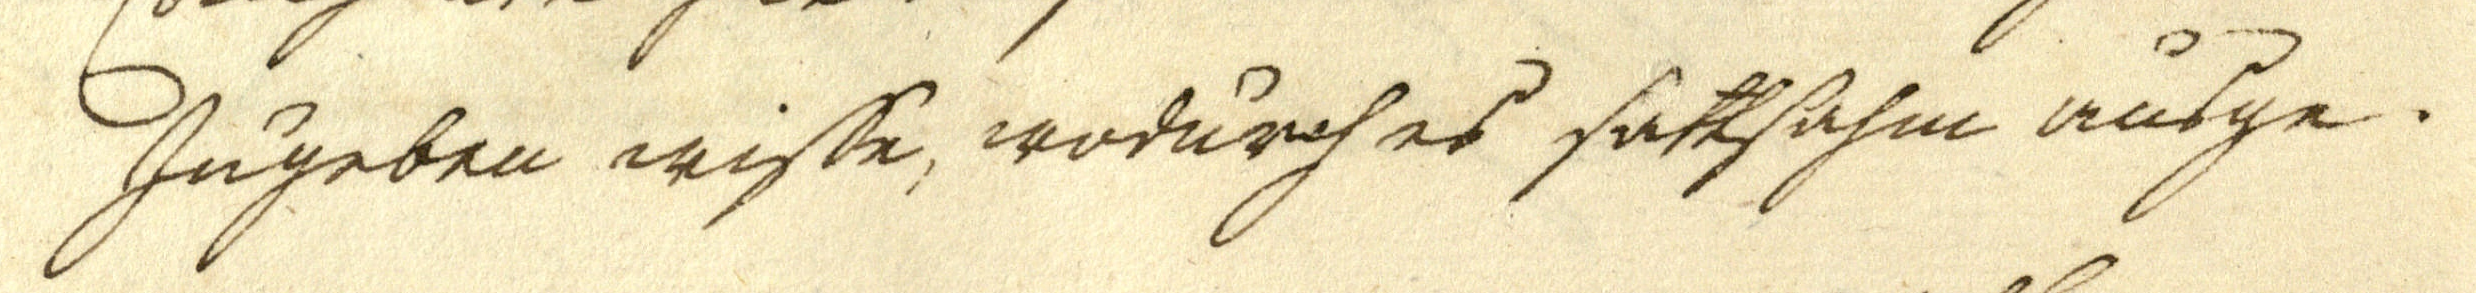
zugeben wisse, wodurch es sattsahm ausge¬
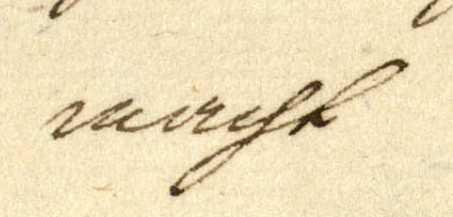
macht
